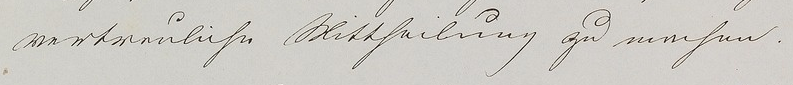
vertrauliche Mittheilung zu machen.
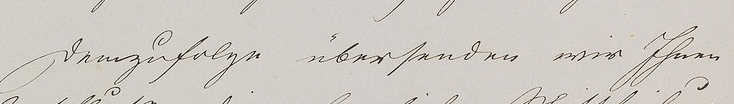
Demzufolge übersenden wir Ihnen
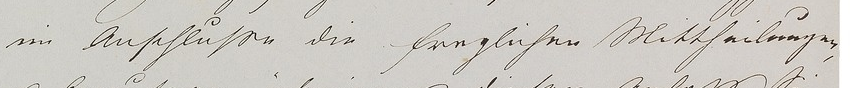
im Anschluße die fraglichen Mittheilungen
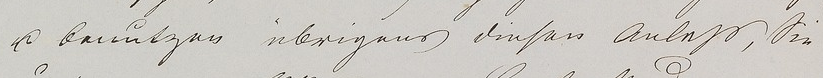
& benutzen übrigens diesen Anlaß, Sie
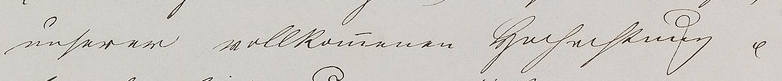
unserer vollkommenen Hochachtung &
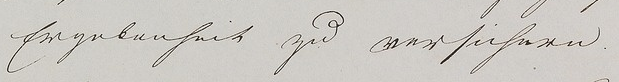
Ergebenheit zu versichern.
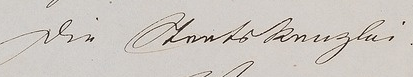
Die Staatskanzlei:
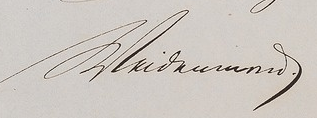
Weidenmann.
